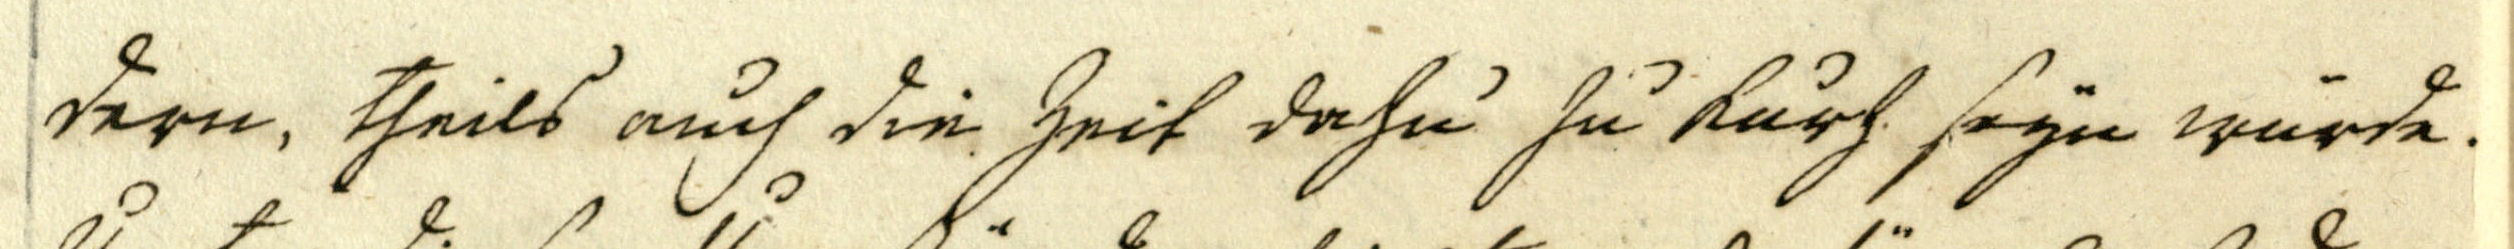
dern, theils auch die Zeit dazu zu kurz seÿn würde.
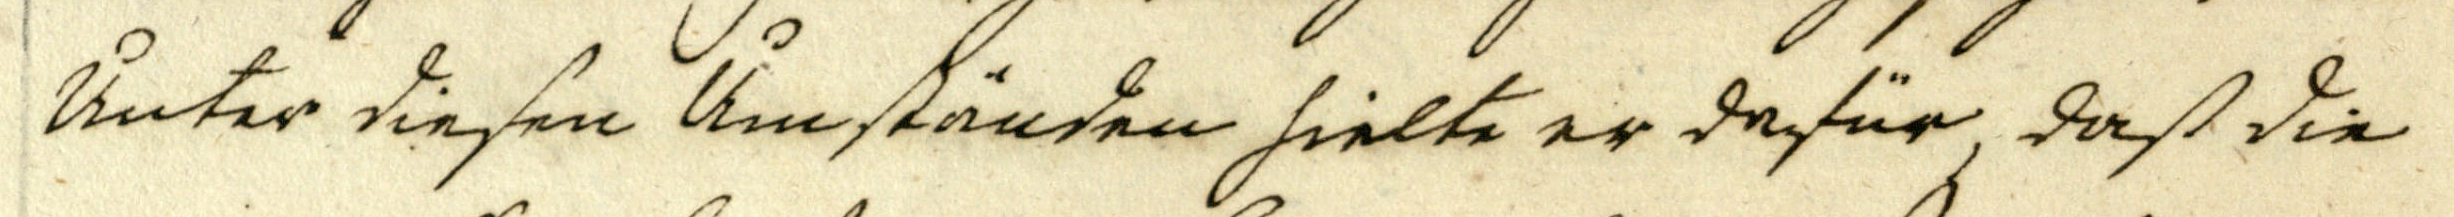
Unter diesen Umständen hielte er dafür, daß die
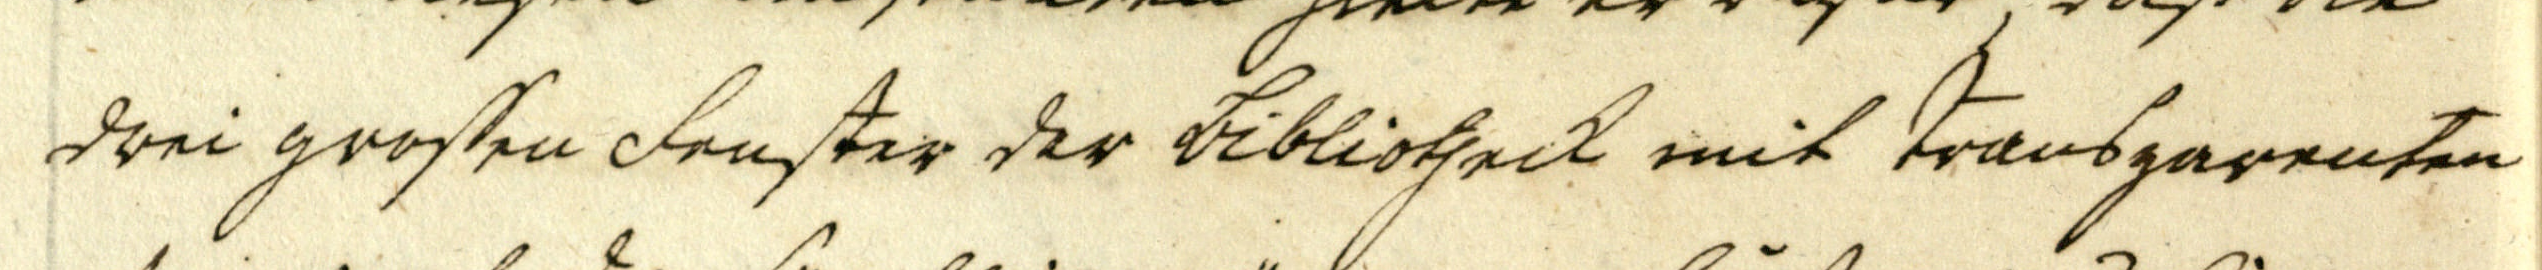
den grossen Fenster der Bibliotheck mit Transparenten
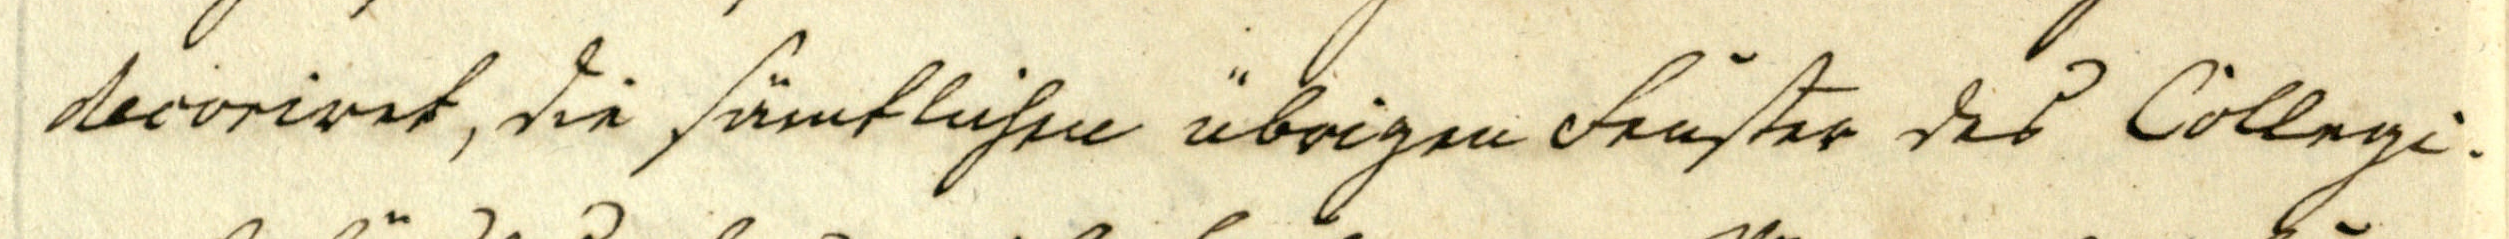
decoriret, die sämtlichen übrigen Fenster des Collegi¬
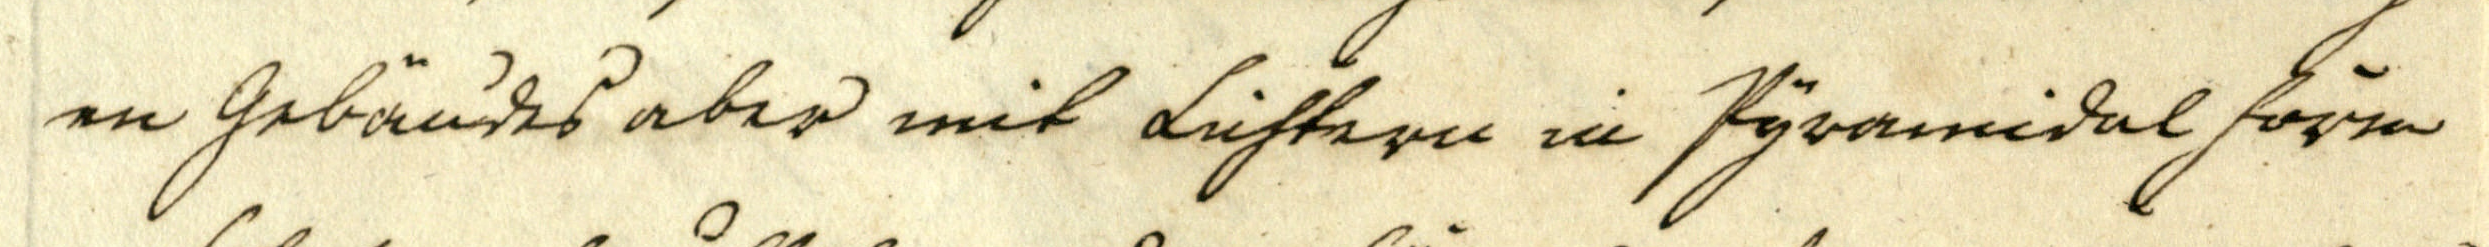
en Gebäudes aber mit Lichtern in Pÿramidal Form
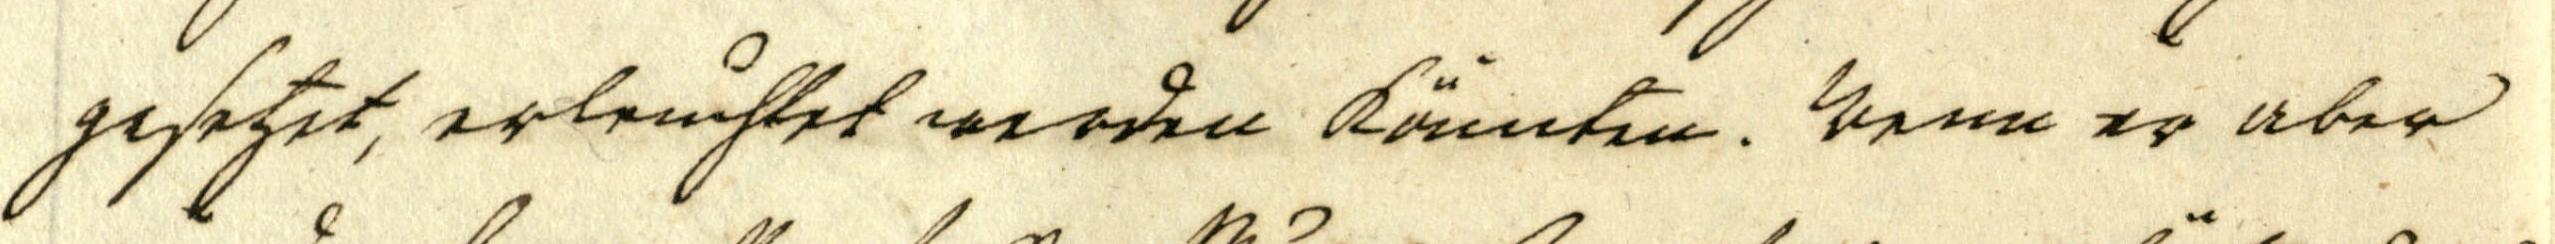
gesetzet, erleuchtet werden könnten. Wenn er aber
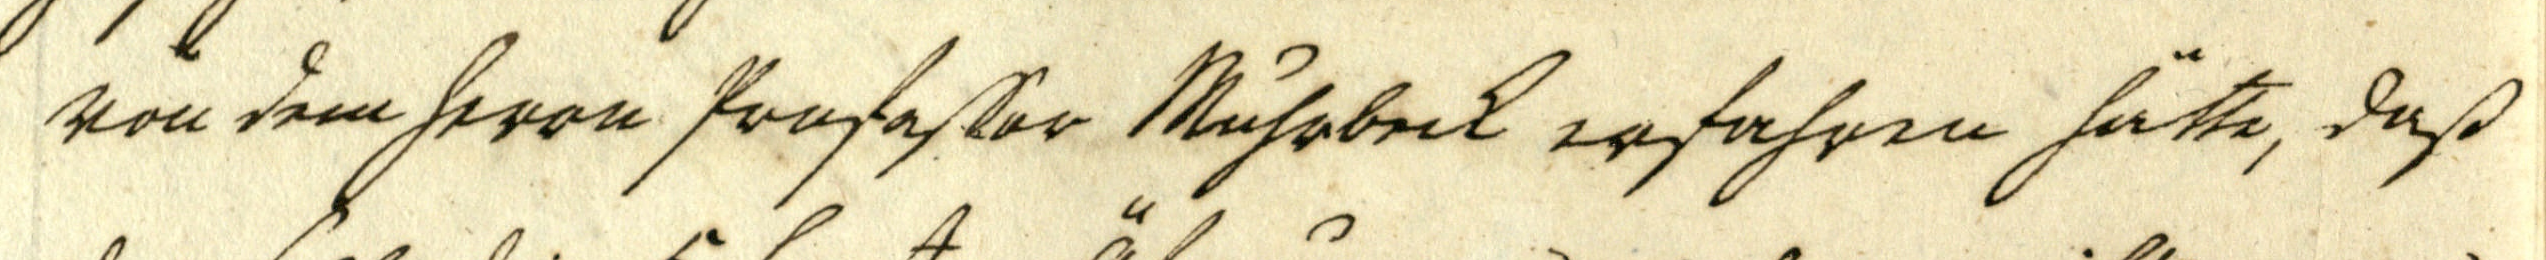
von dem Herrn Professor Muhrbeck erfahren hätte, daß
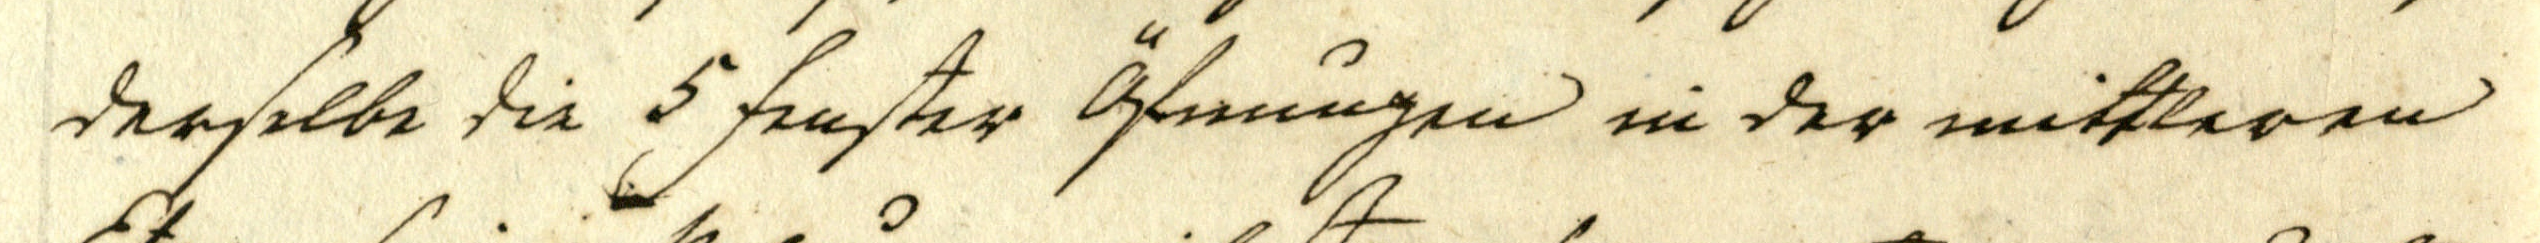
derselbe die 5 Fenster Öfnungen in der mittleren
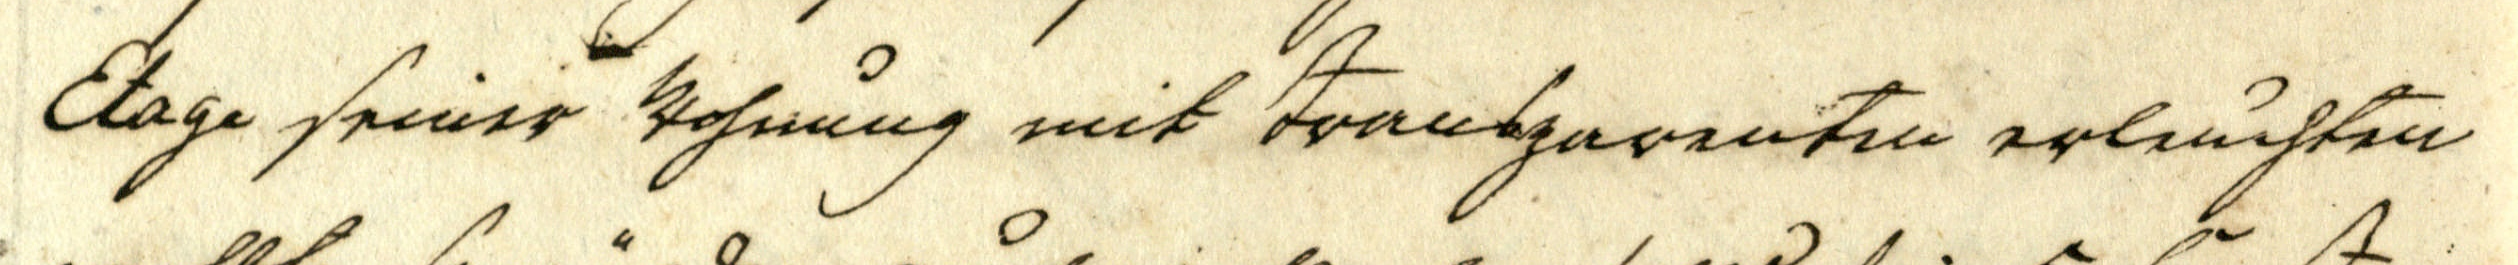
Etage seiner Wohnung mit Transparenten erleuchten
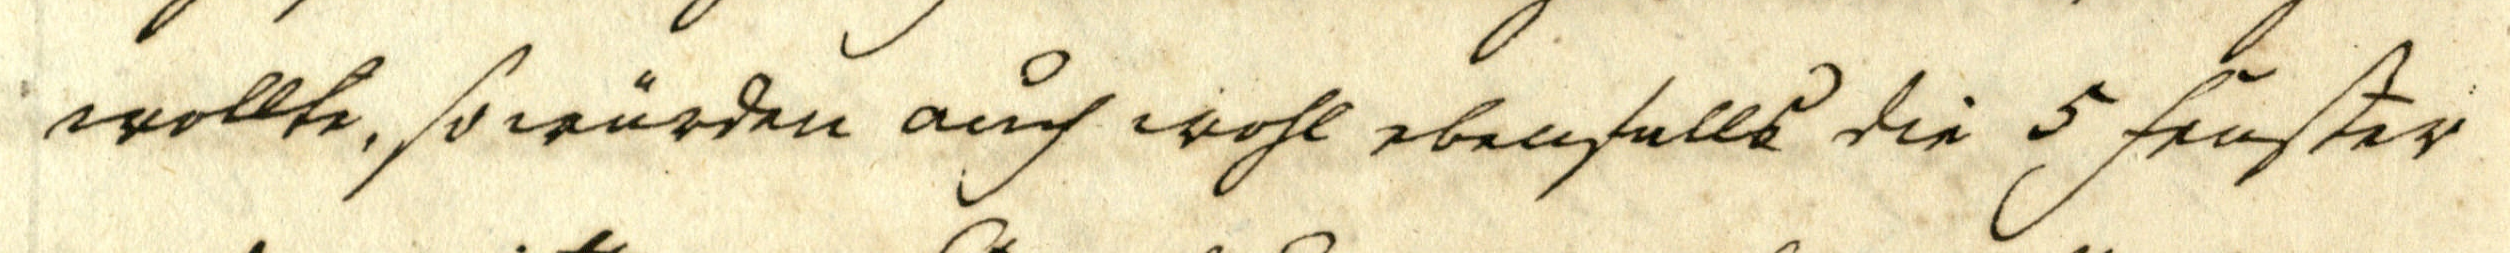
wollte, so würden auch wohl ebenfalls die 5 Fenster
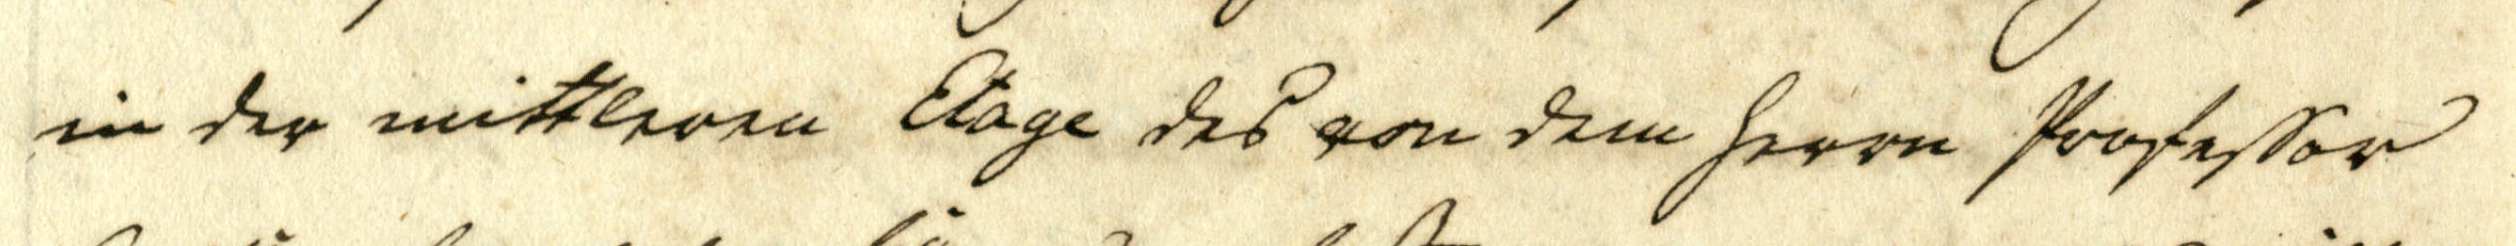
in der mittleren Etage des von dem Herrn Professor
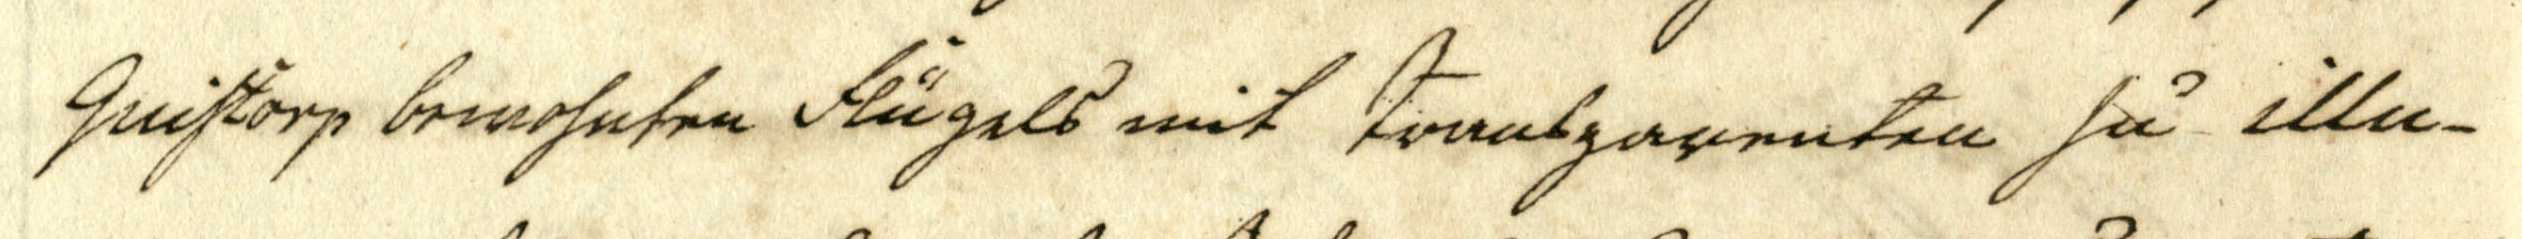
Quistorp bewohnten Flügels mit Transparenten zu illu¬
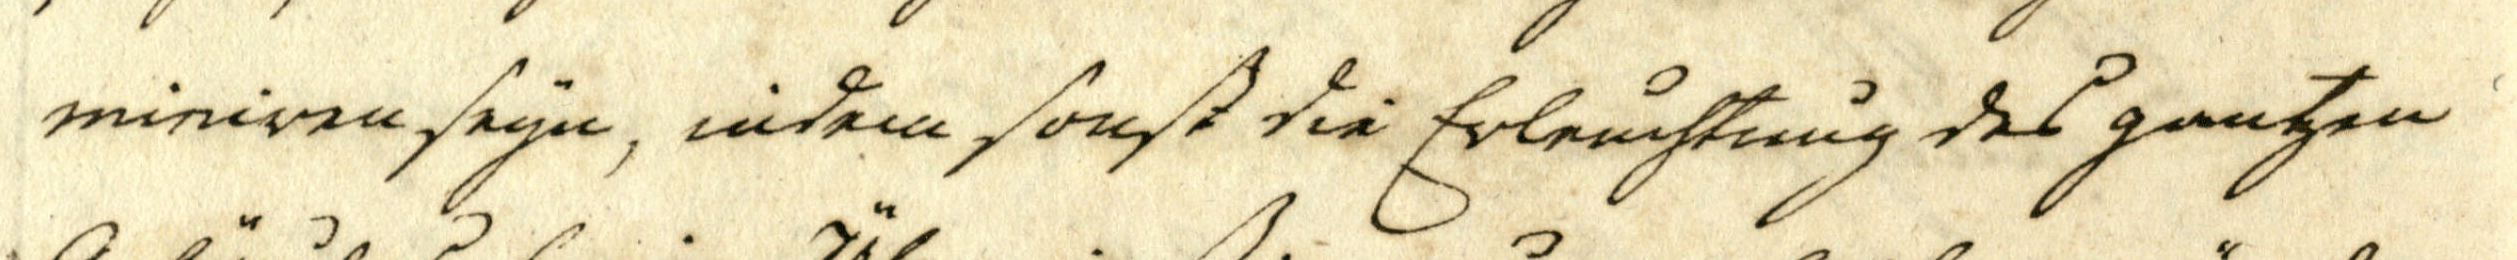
miniren seÿn, indem sonst die Erleuchtung des gantzen
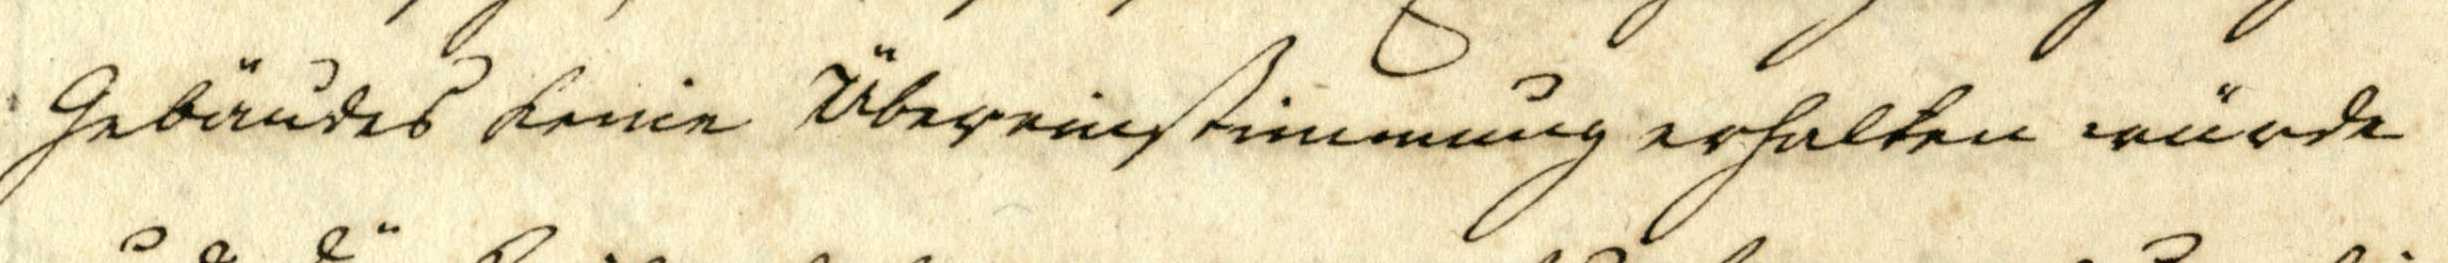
Gebäudes keine Übereinstimmung erhalten würde
